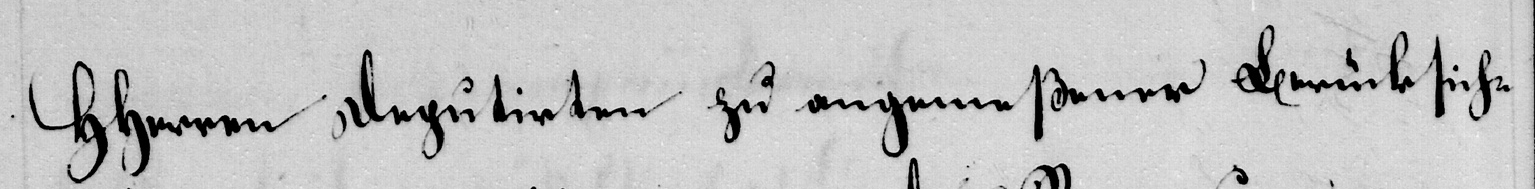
HHerren Deputirten zu angemeßener Berücksich¬
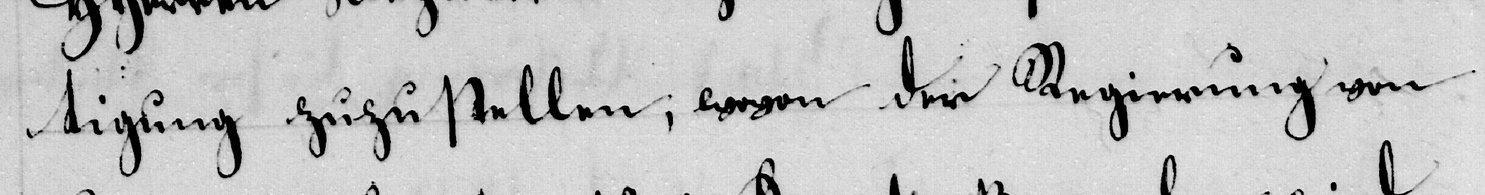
tigung zuzustellen, wovon der Regierung von
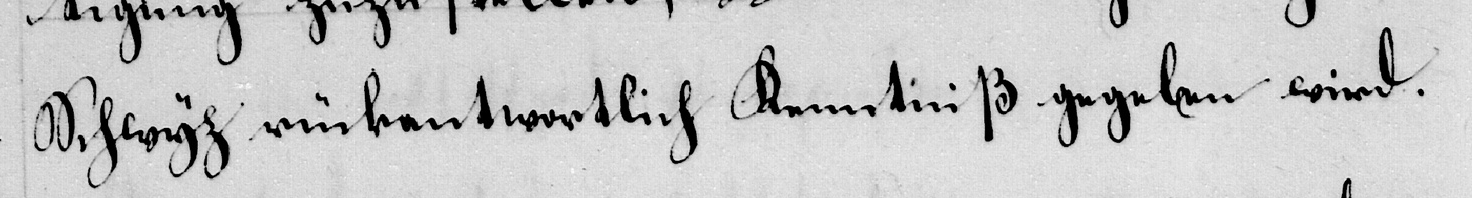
Schwyz rückantwortlich Kenntniß gegeben wird.
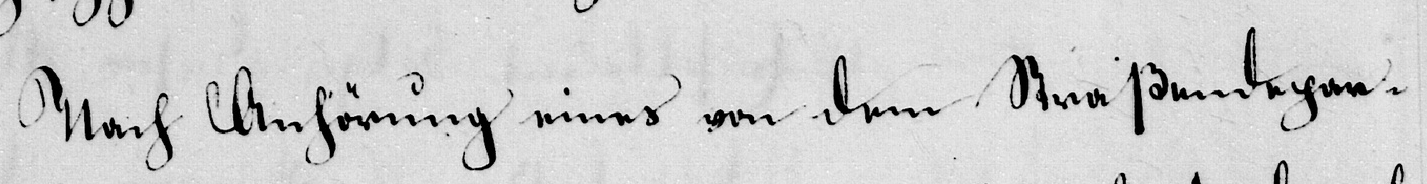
Nach Anhörung eines von dem Straßendepar¬
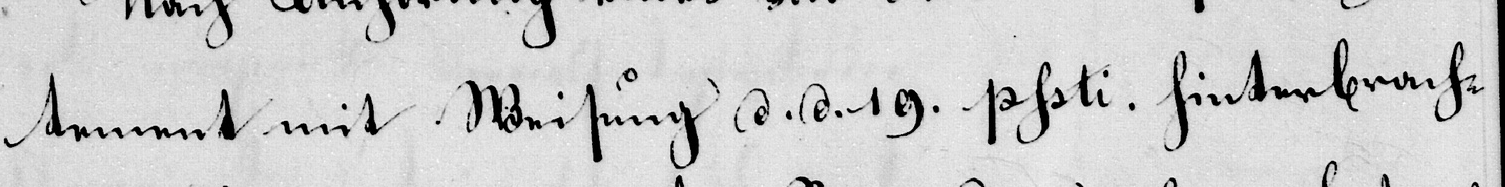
tement mit Weisung d. d. 19. pssti. hinterbrach¬
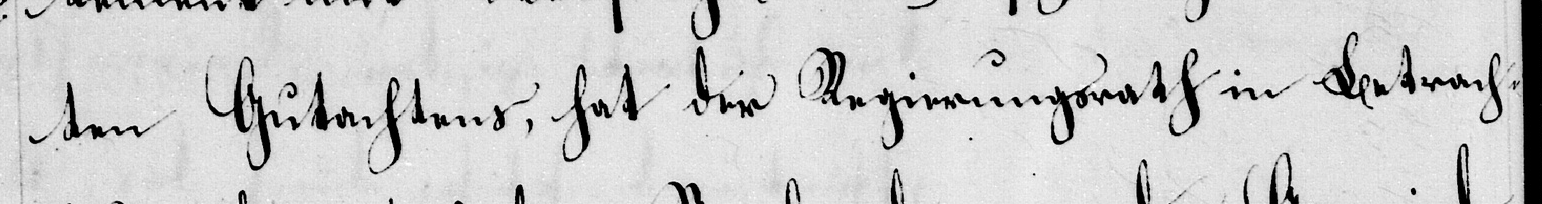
ten Gutachtens, hat der Regierungsrath in Betrach¬
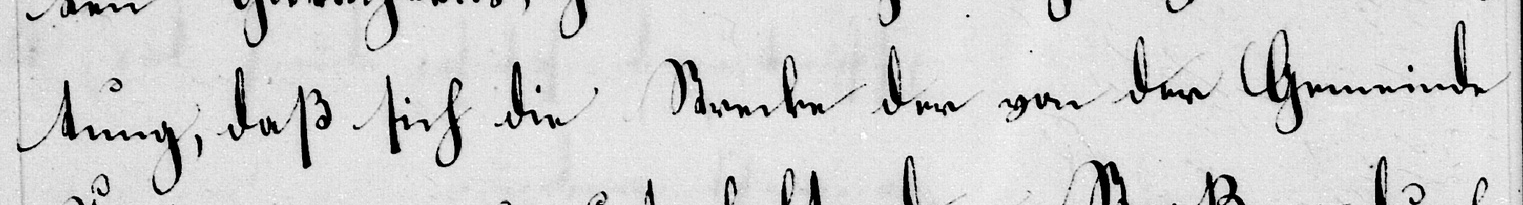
tung, daß sich die Strecke der von der Gemeinde
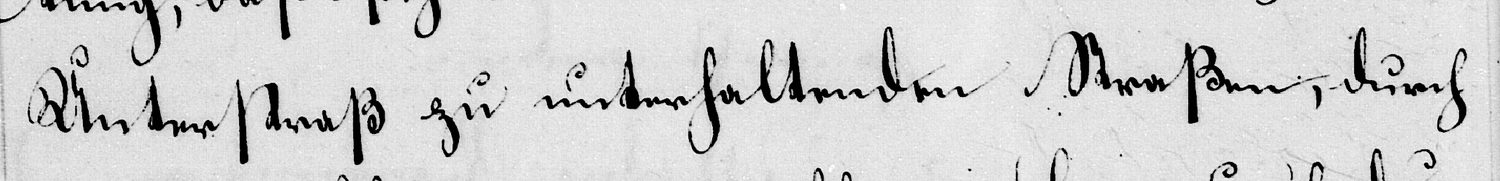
Unterstraß zu unterhaltenden Straßen, durch
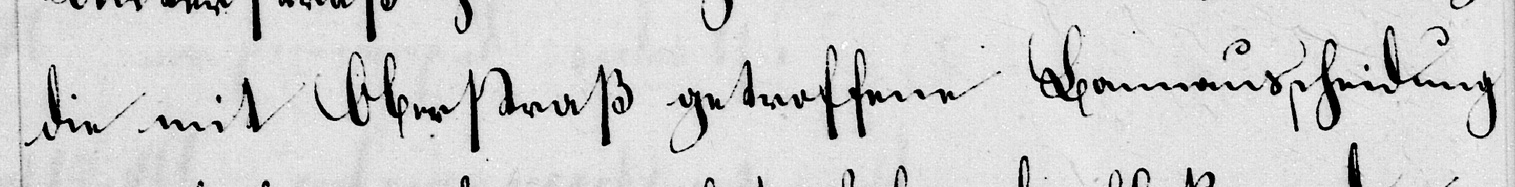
die mit Oberstraß getroffene Bannausscheidung
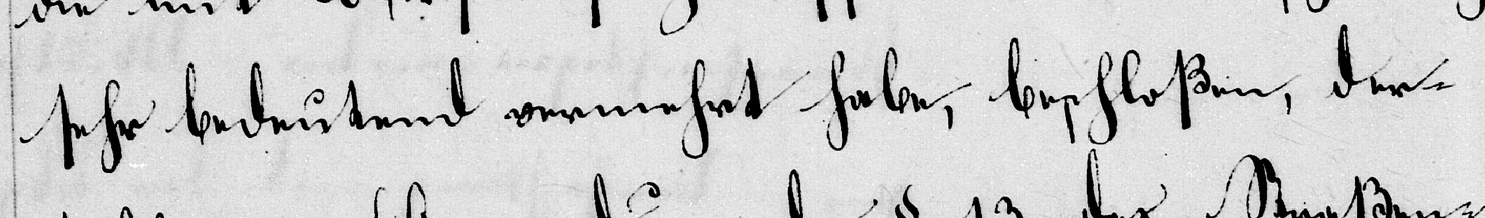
sehr bedeutend vermehrt habe, beschloßen, der¬
